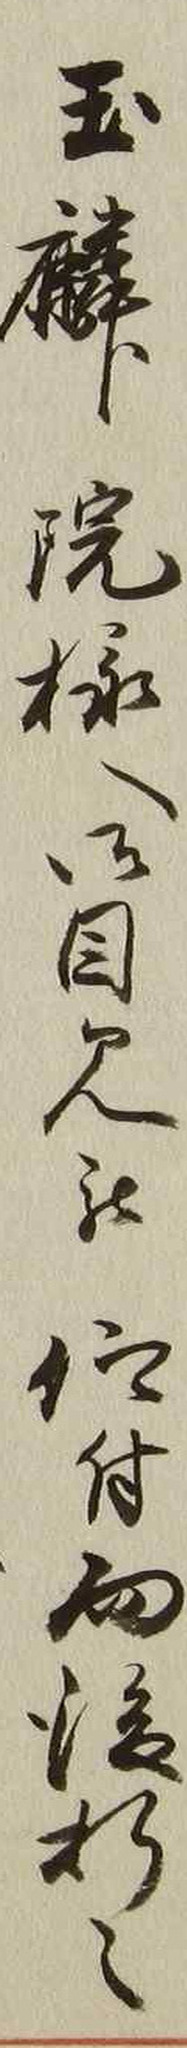玉鱗院様へ御目見被仰付向後折々
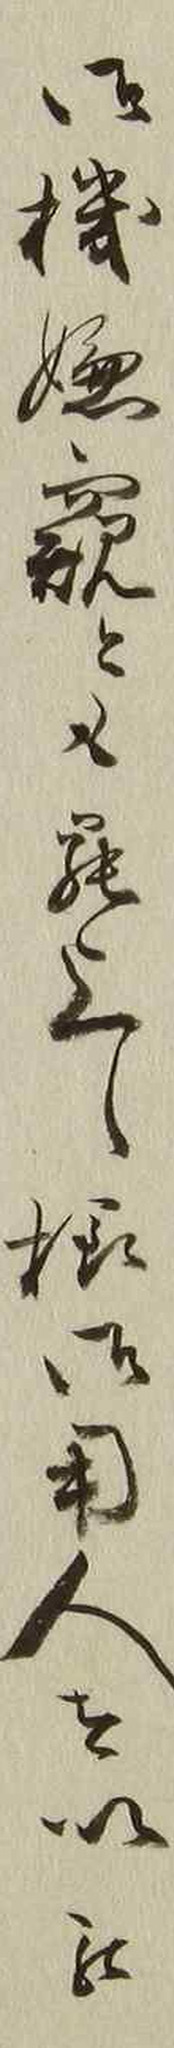御機嫌窺とも罷上候様御用人を以被
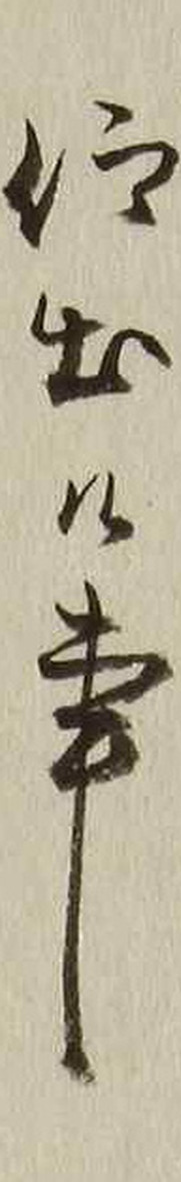仰出候事
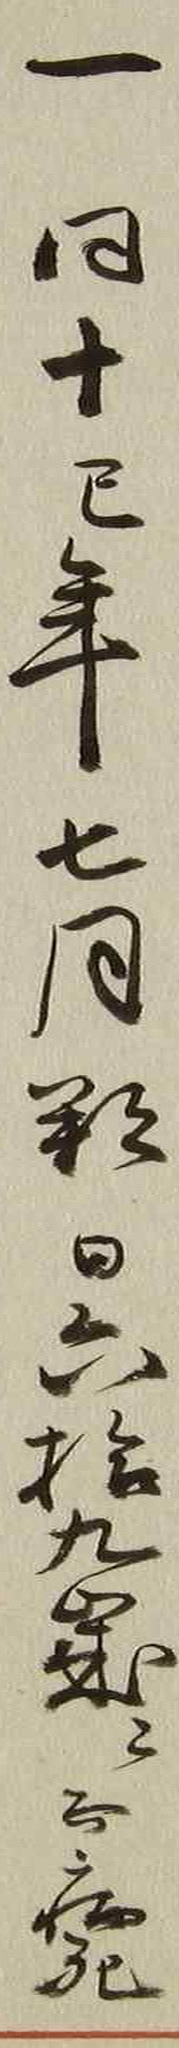一同十巳年七月朔日六拾九歳ニ而病死
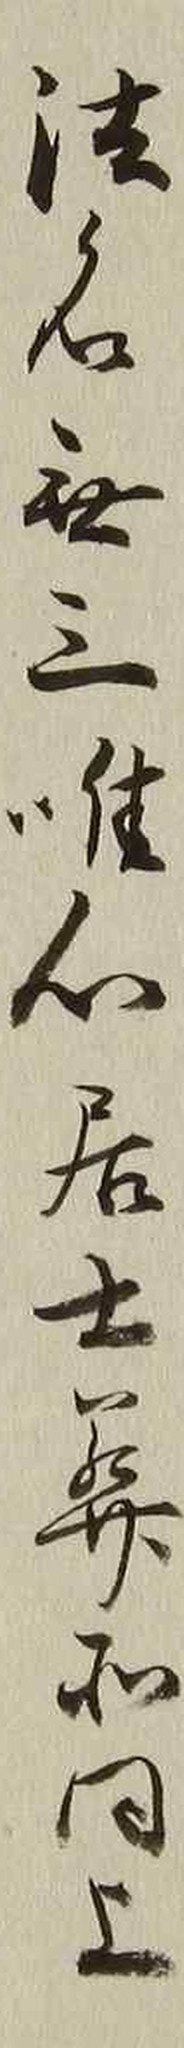法名無三唯心居士葬所同上
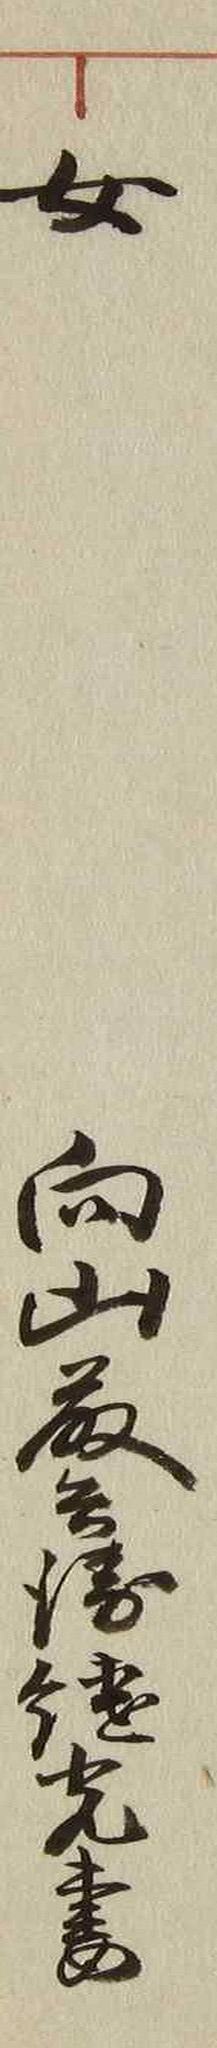女向山藤兵衛継光妻
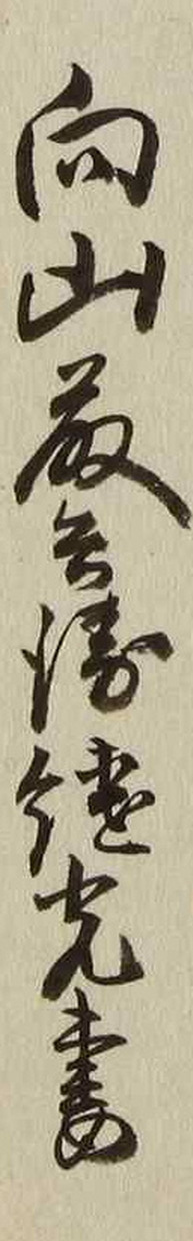女向山藤兵衛継光妻
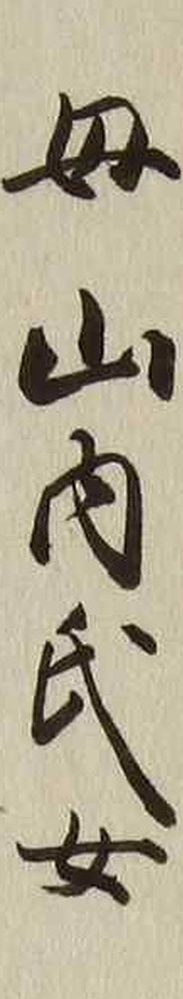母山内氏女
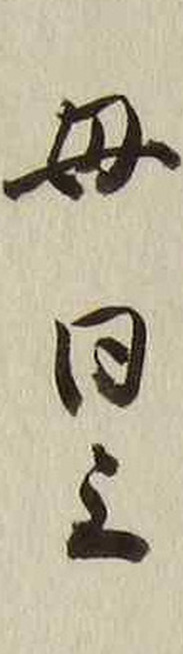母同上
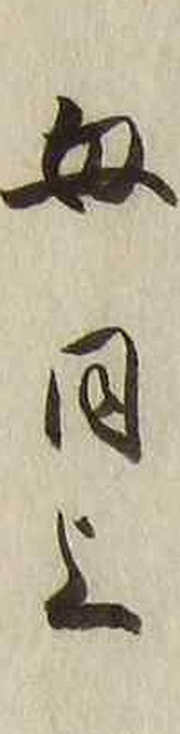母同上

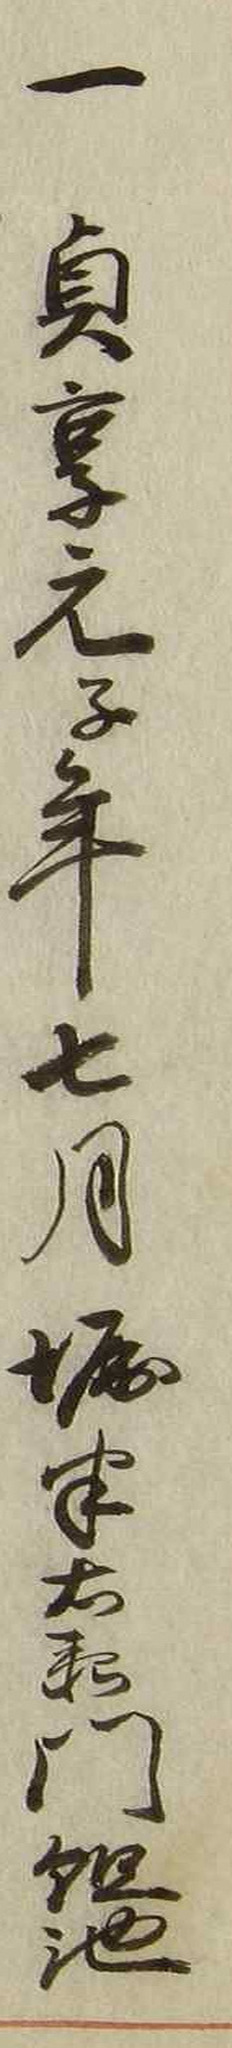一貞享元子年七月堀半右衛門組池
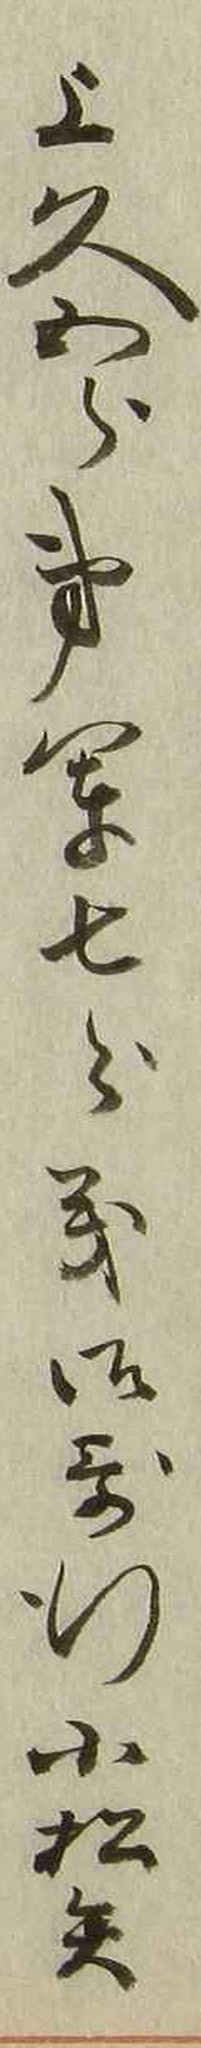上久五郎弟軍七郎義御歩行小松矢
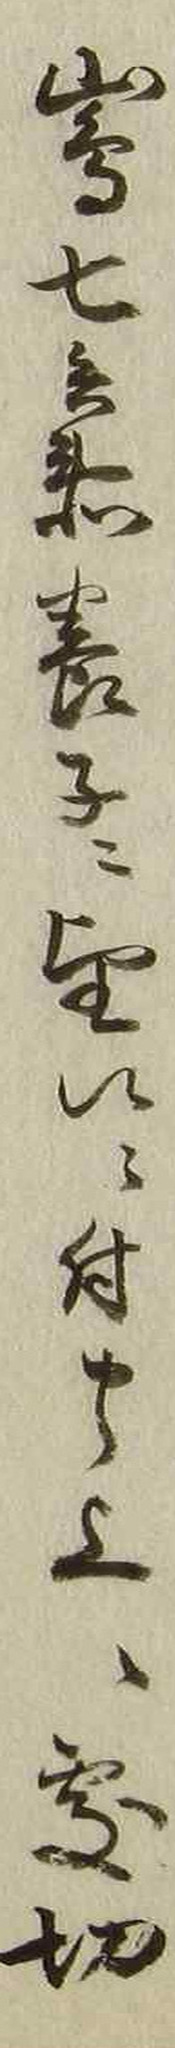島七兵衛養子ニ望候ニ付申上候処切
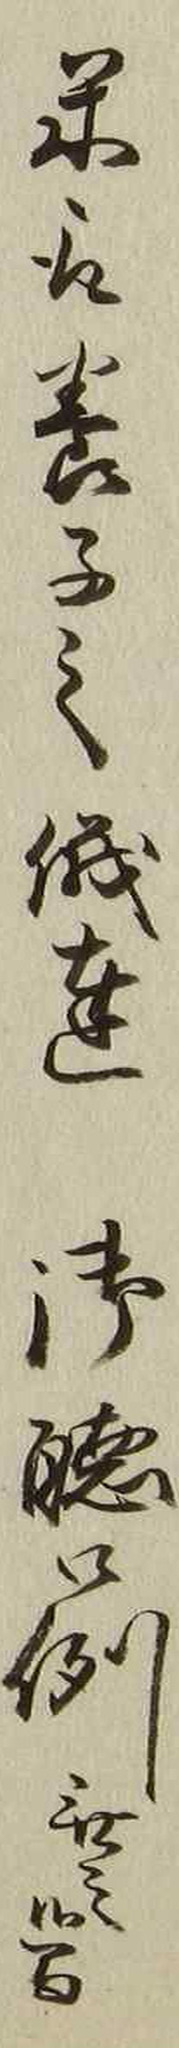米取養子之儀達御聴候例無之候間
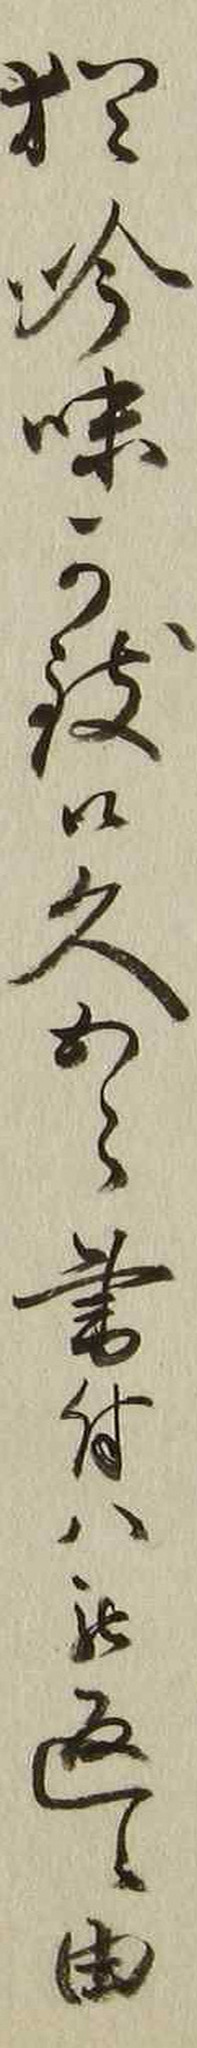猶吟味可致候久五郎書付ハ被返候由
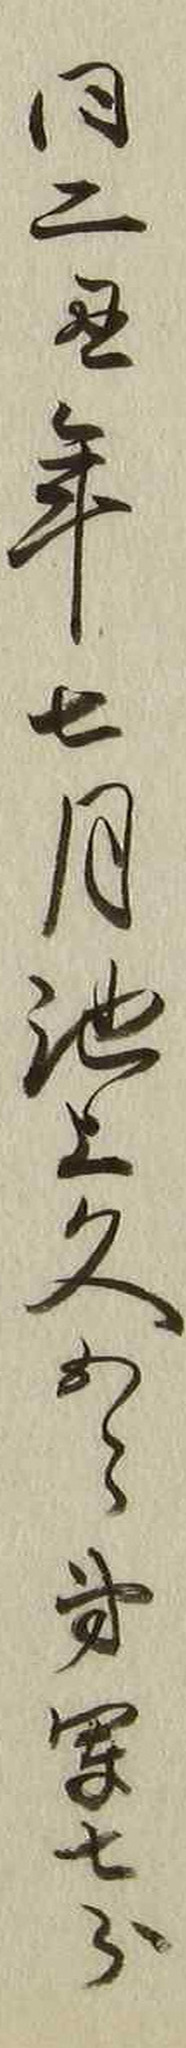同二丑年七月池上久五郎弟軍七郎
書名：諸士系譜　巻之15　い之部15
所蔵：会津若松市立会津図書館
